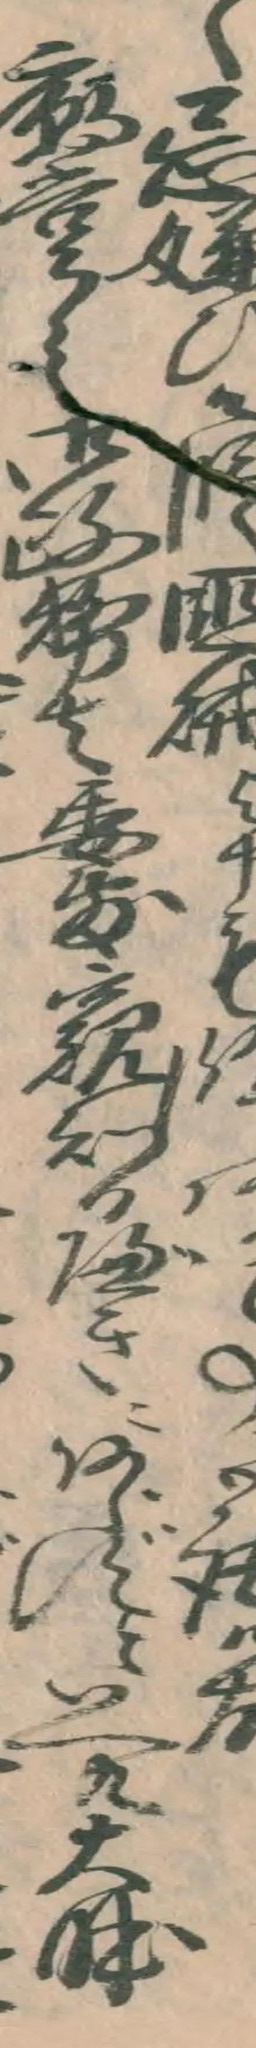廟堂之御政務者委敷窺知るべきニあらずといへ共大躰
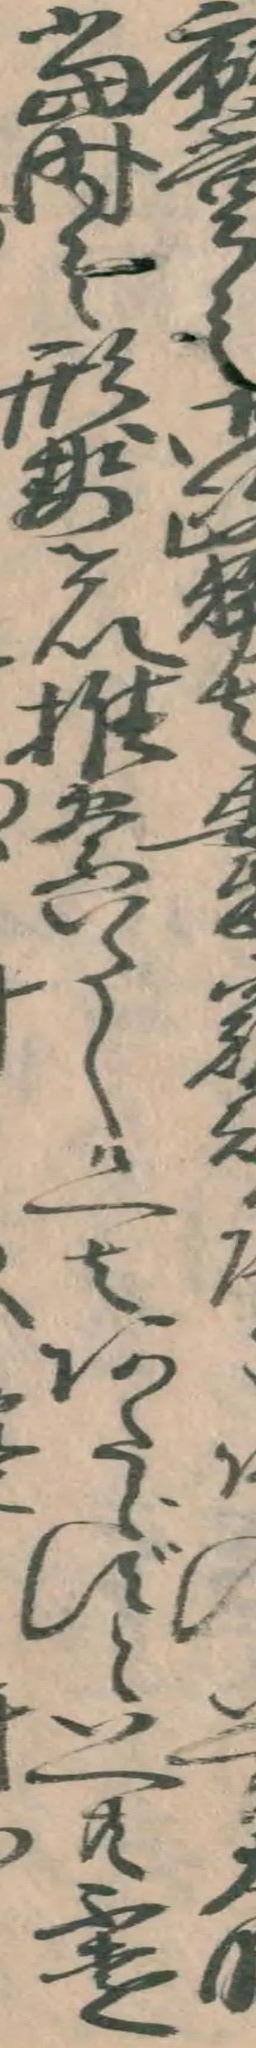當時之形勢を以推察いたし候へ者あたらずといへ共不遠
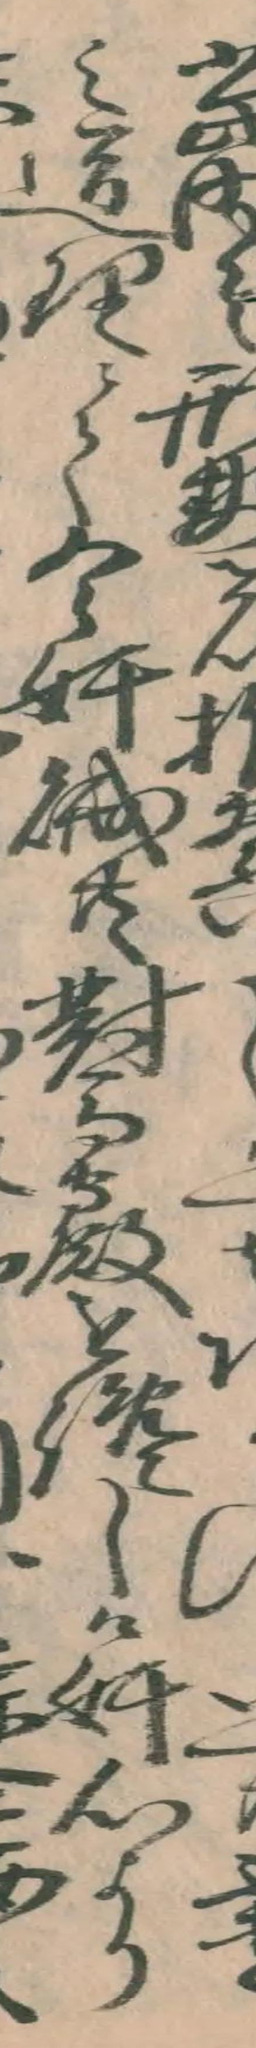之道理二て今奸賊共對馬守殿を讒し候奸心より
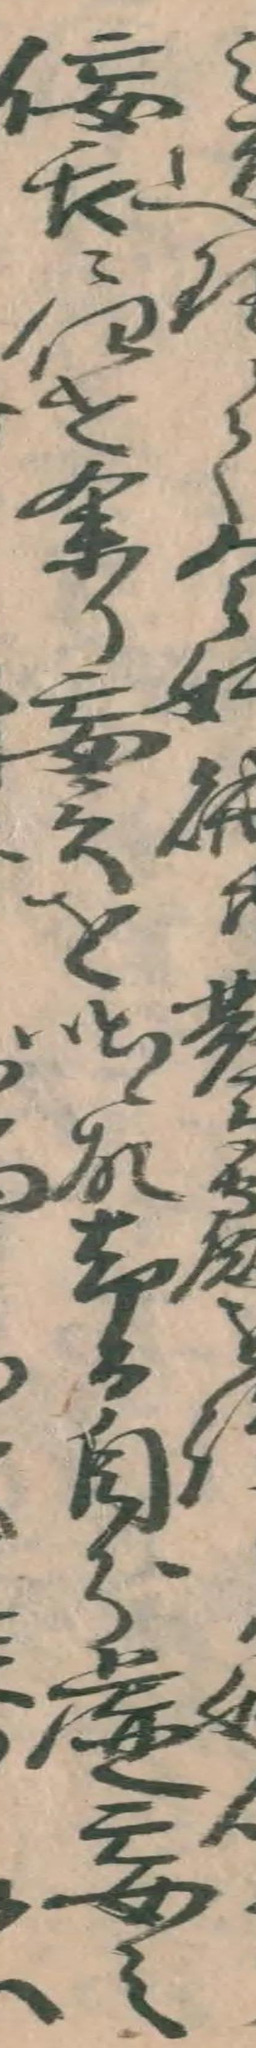侫舌ニ任せ余り妄言を咄候故却而自分虚妄之
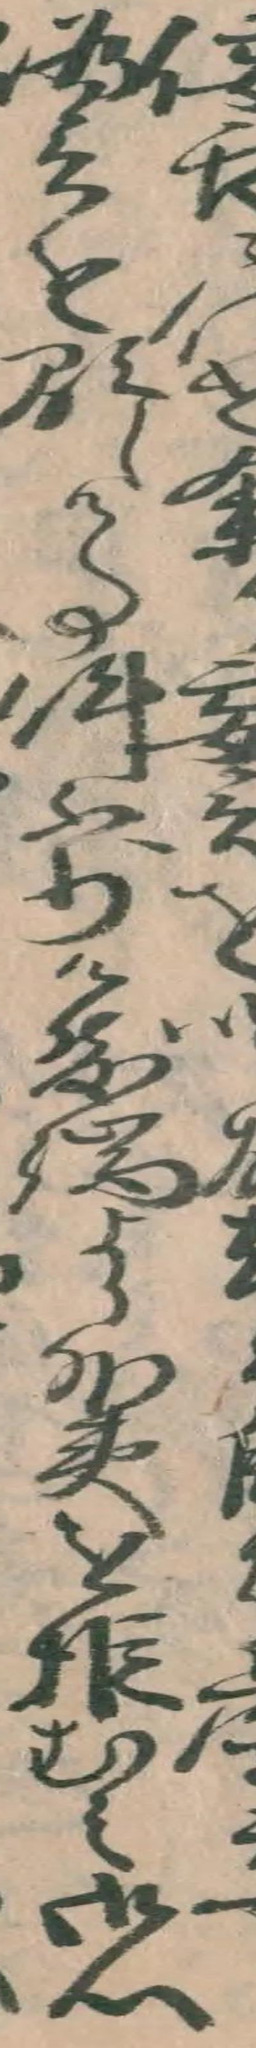偽言を顕し候事件不少候発端より外夷を拒む之御心
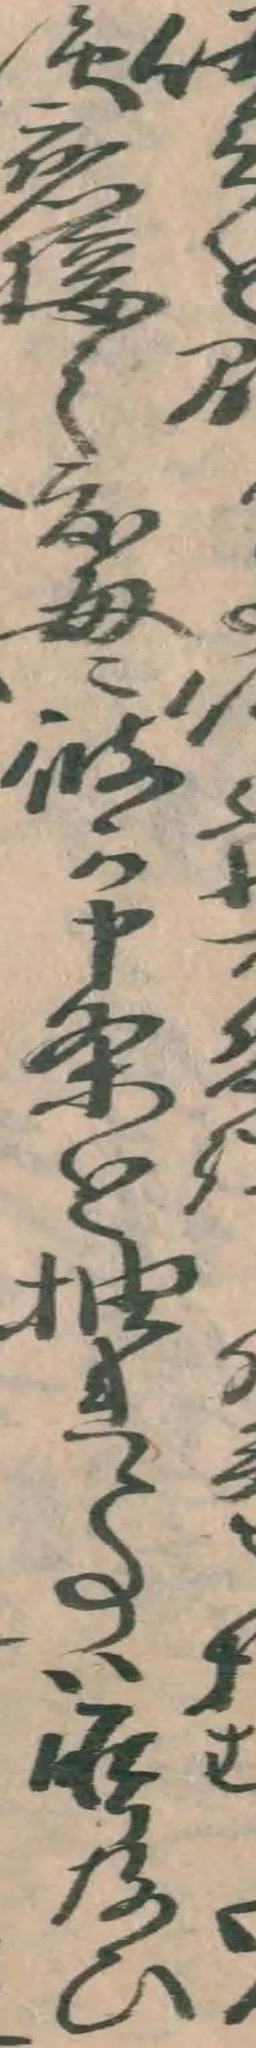強應接之度毎ニ彼か申条を抽れ候事ハ承り及ひ
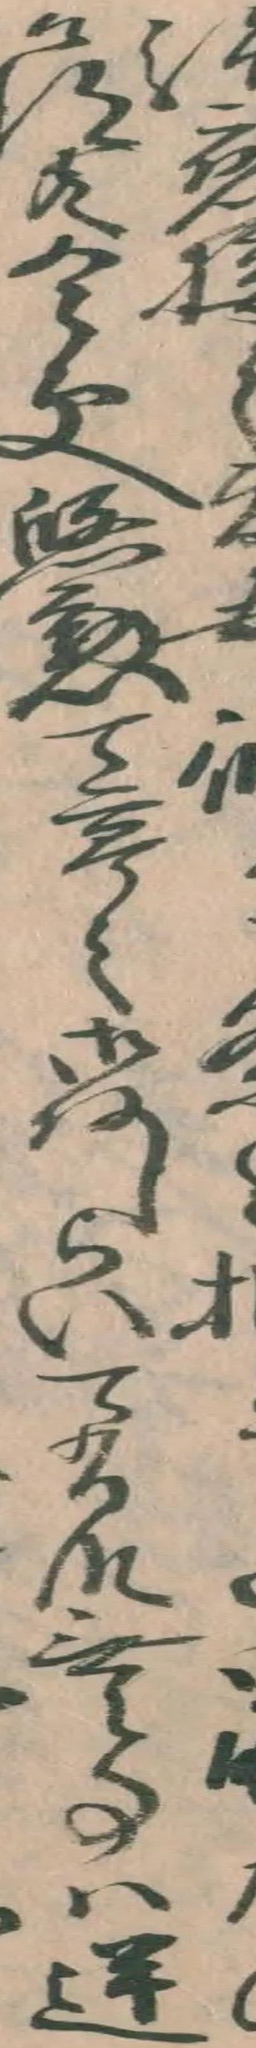候得共今更慇懃丁寧之御あしらい可有様無之事ハ逆
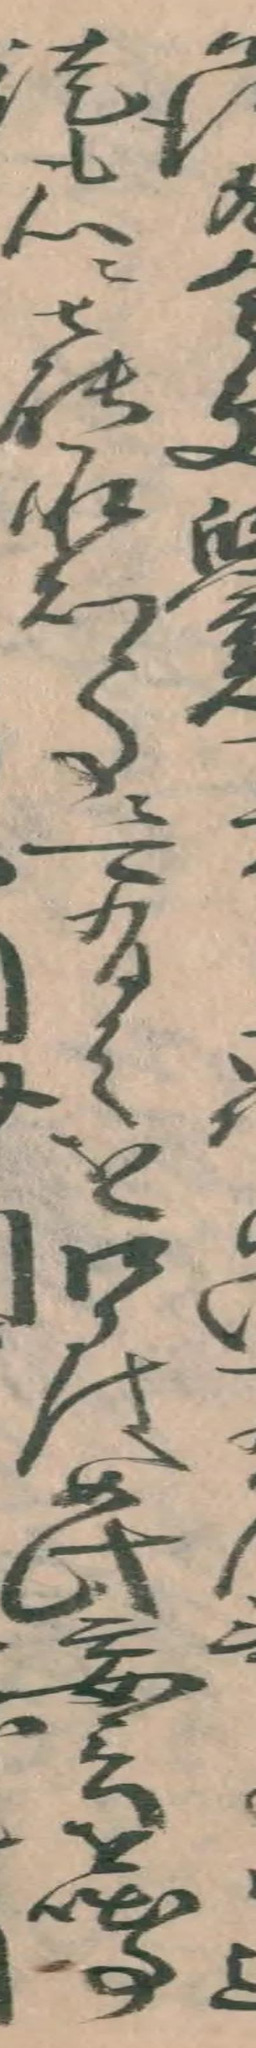徒も心ニ者能承知候事ニ可有之を口には如此妄言を咄事
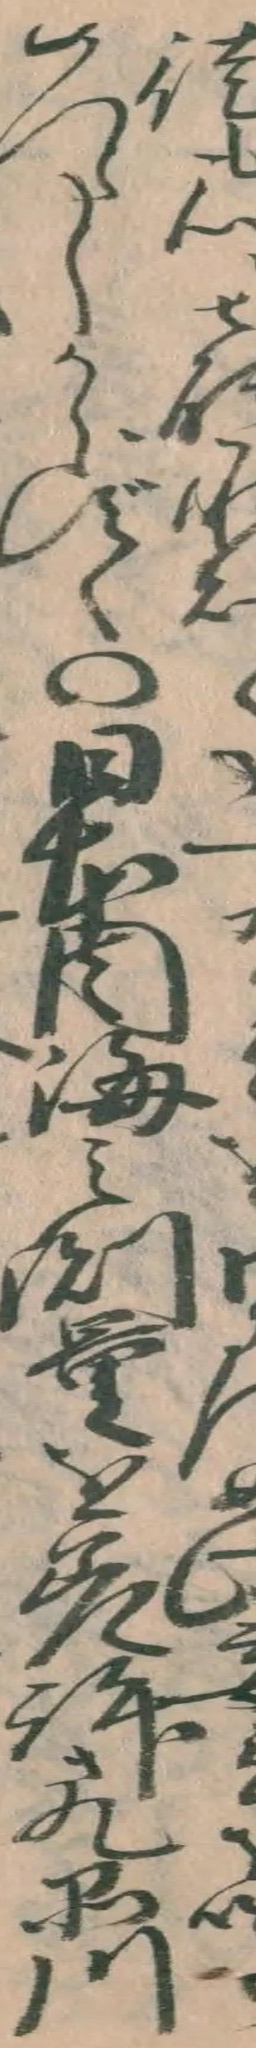めつらしからず候○日本周海之測量を差許され品川
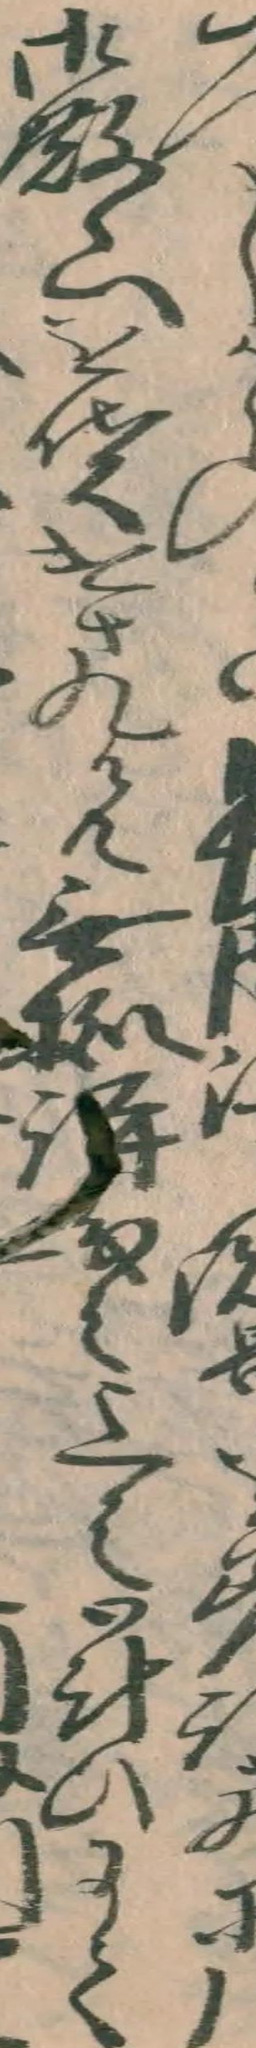御殿山を貸遣され候共無拠評義之上之御計ひにて
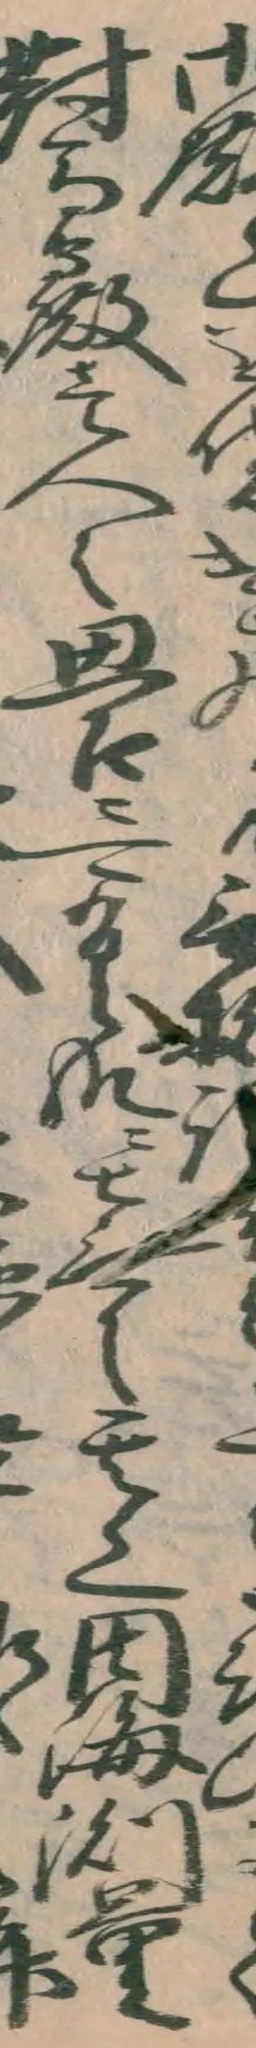對馬守殿壱人之思召ニ可有之様ニ者無之其上周海測量
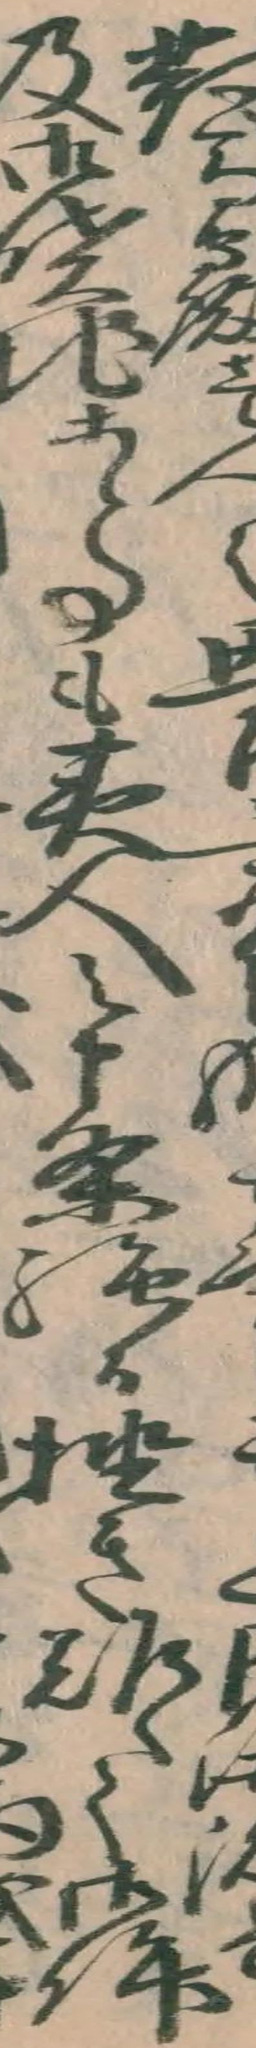及御貸地等之事も夷人之申条強而挫き難候て御許
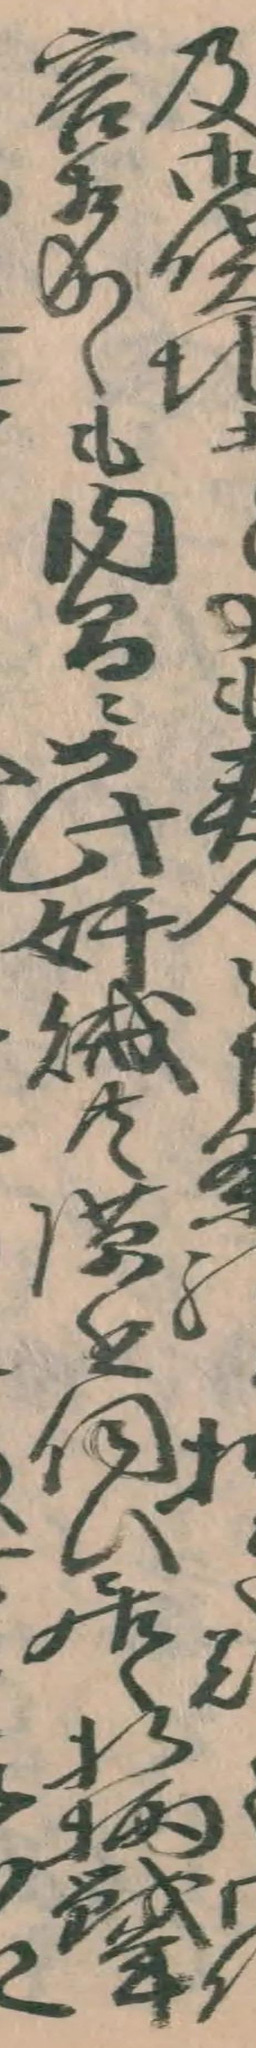容相成候も内間ニ如此奸賊共隙を伺ひ居候折柄戦争
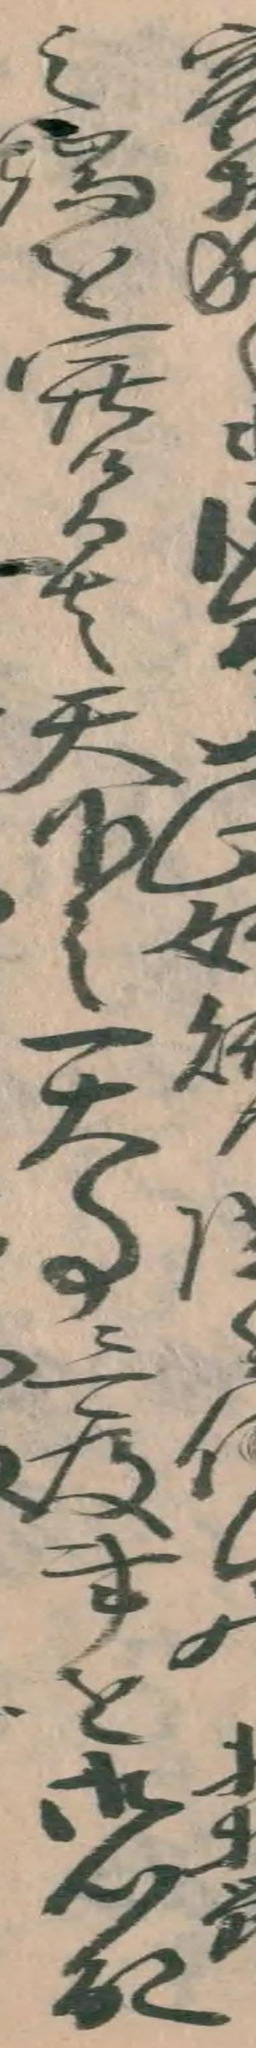之端を開候而者天下之一大事ニ可及事を御心配
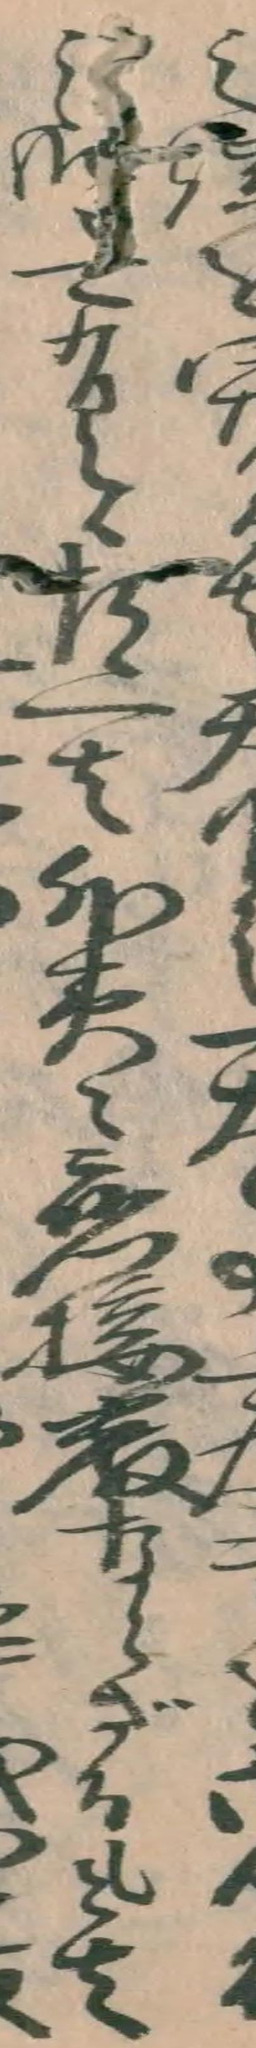之様ニ可有之候左候へ者外夷之應接厳ならざるもと者
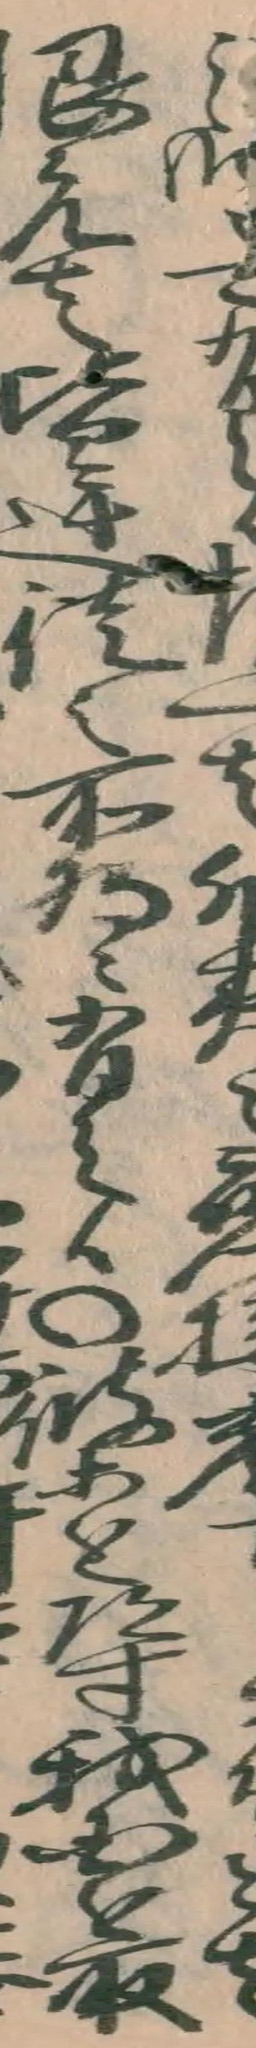根元者皆逆徒之所為ニ有之候○彼等を導我国を取
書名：麗斎叢書. 20
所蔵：国立国会図書館 National Diet Library, JAPAN
